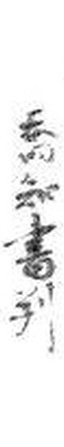喬知書判
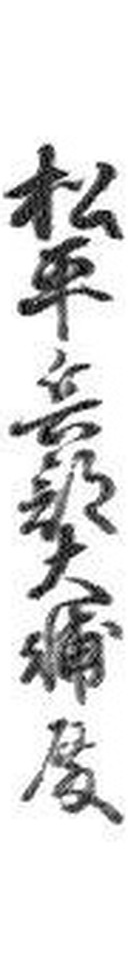松平兵部大輔殿
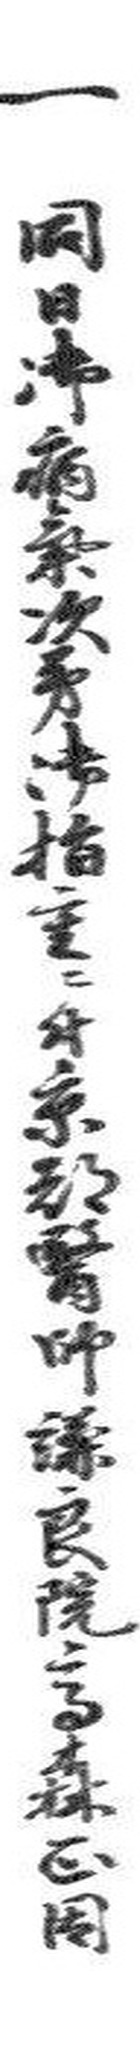一同日御病気次第御指重ニ付京都医師謙良院高森正
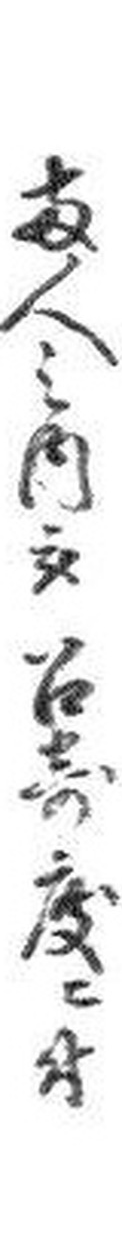両人之内被召寄度ニ付
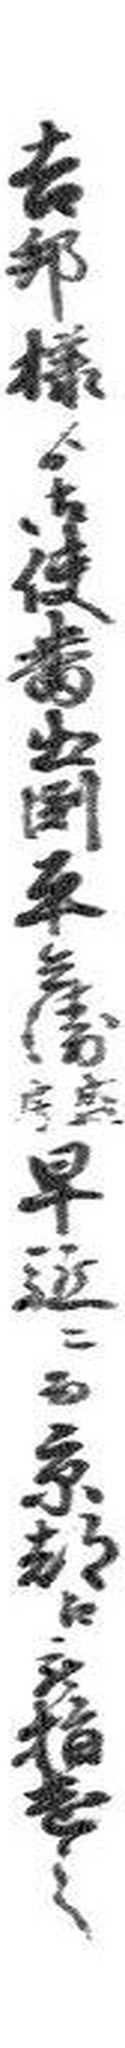吉邦様ゟ御使番出渕平兵衛盛房早駆ニ而京都江被指遣之
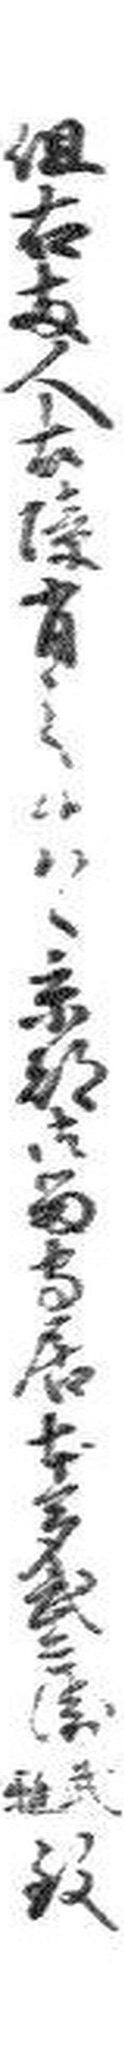但右両人故障有之候ハヽ京都御留守居本多武兵衛武雅致
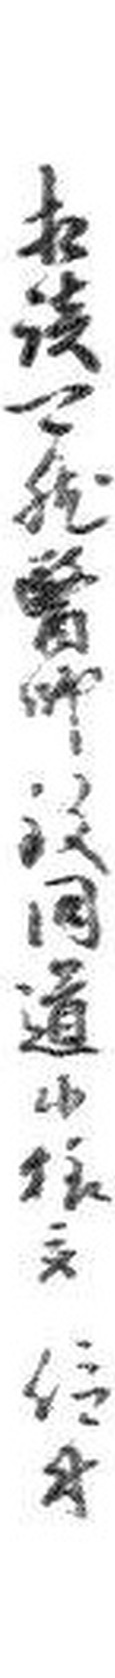相談可然医師致同道候様被仰付

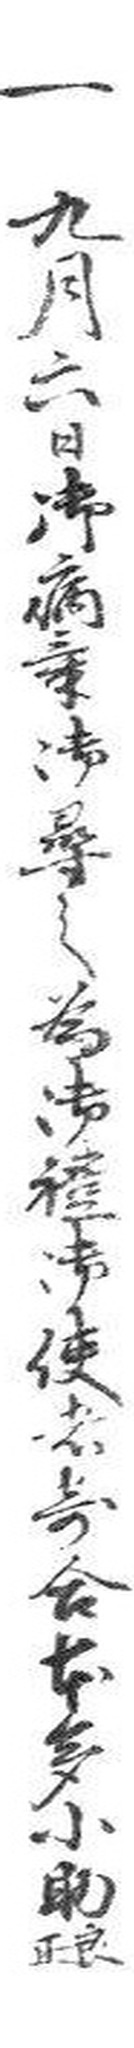一九月六日御病気御尋之為御礼御使者寄合本多小助良正
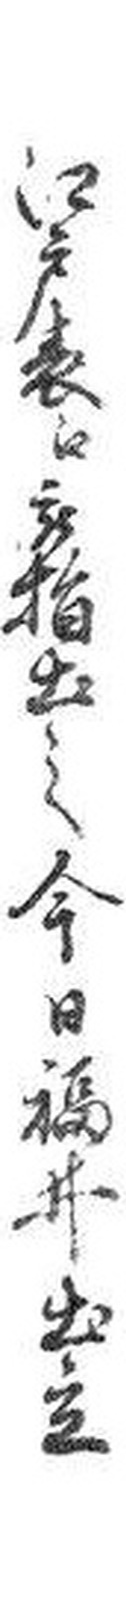江戸表江被指出之今日福井出立
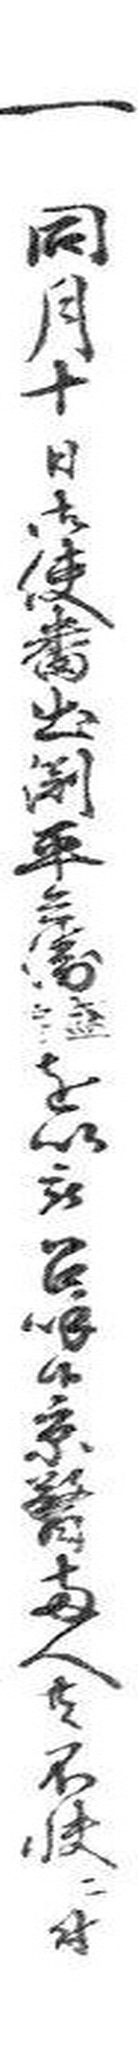一同月十日御使番出渕平兵衛盛房を以被召呼候京医両人共不快ニ付
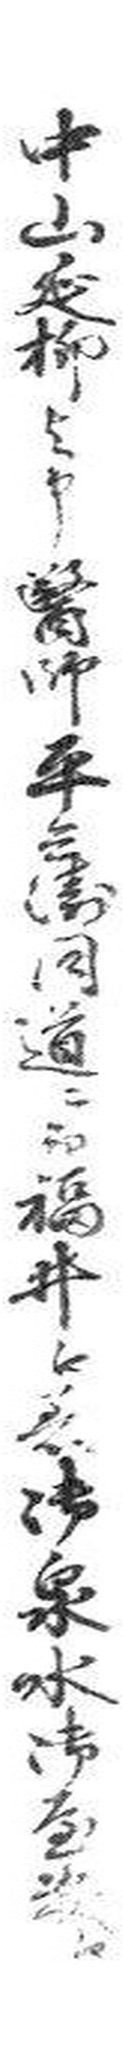中山延柳と申医師平兵衛同道ニ而福井江着御泉水御屋敷江
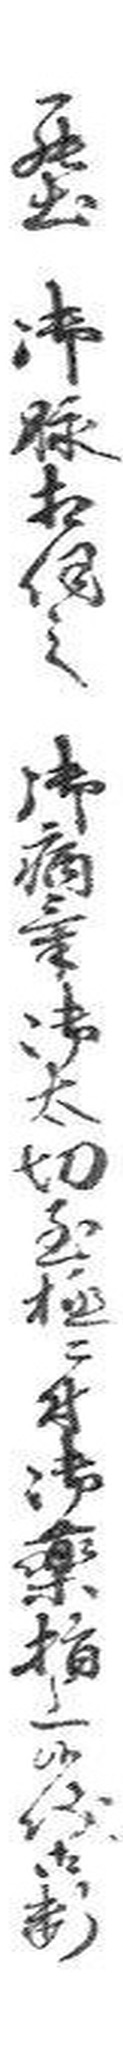罷出御脈相伺之御病気御太切至極ニ付御薬指上候儀御断
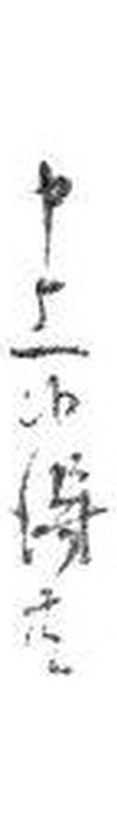申上候得共
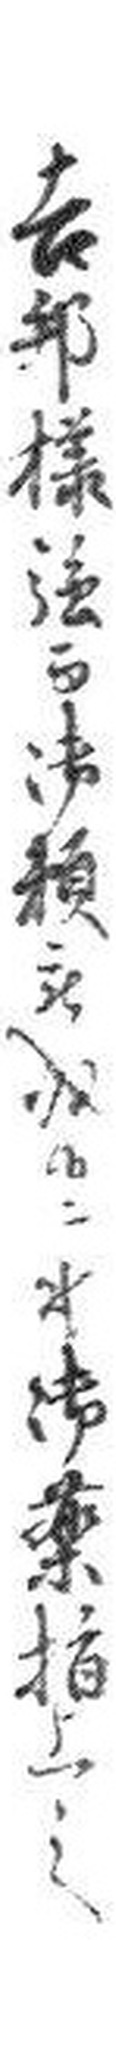吉邦様強而御願被成候ニ付御薬指上之
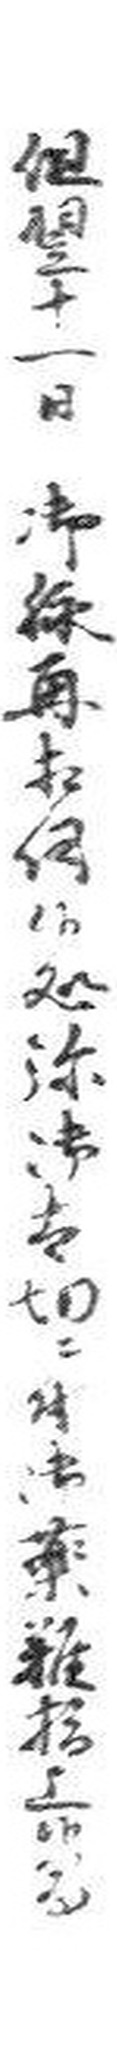但翌十一日御脈再相伺候処弥御太切ニ付御薬難指上候間
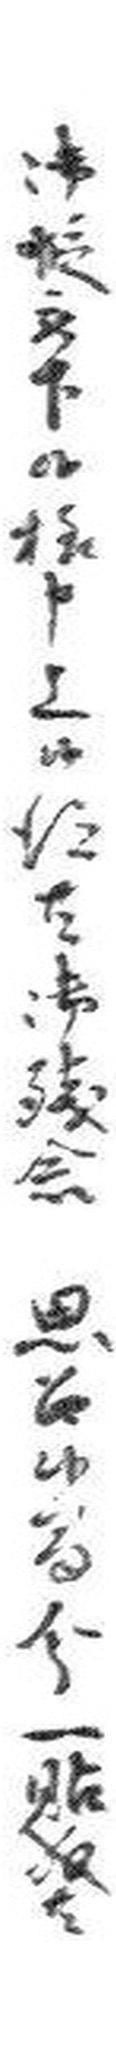御暇被下候様申上候得共御残念思召候間今一貼成共
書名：家譜 二十六 吉品公 従宝永七年到正徳二年
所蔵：福井県文書館 Fukui Prefectural Archives
